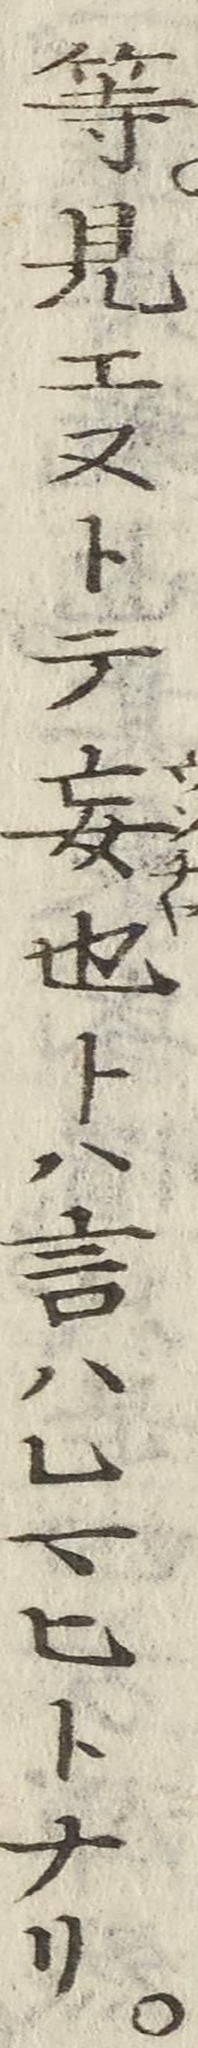等。見エヌトテ妄也トハ言ハレマヒトナリ。
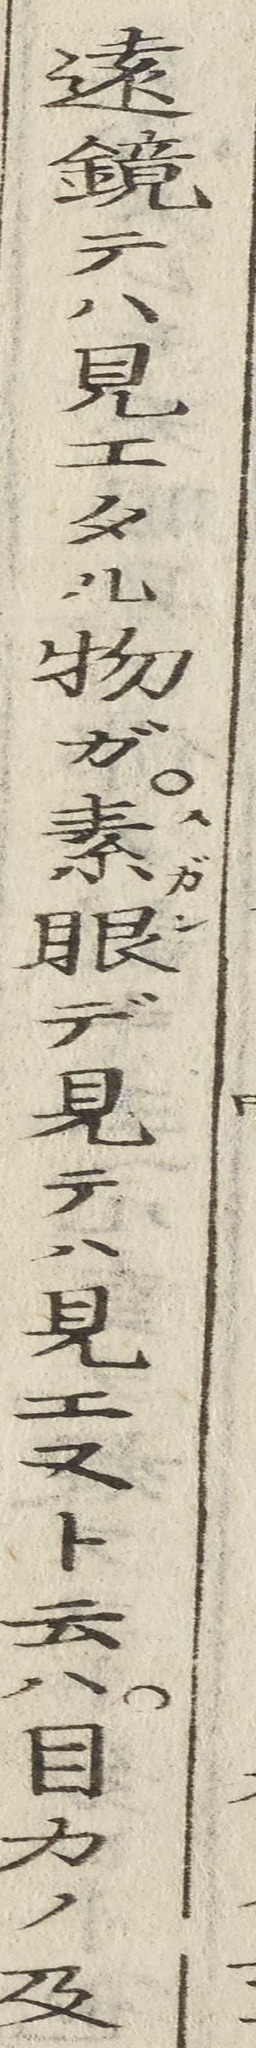遠鏡テハ見エタル物ガ。素眼デ見テハ見エヌト云ハ。目力ノ及
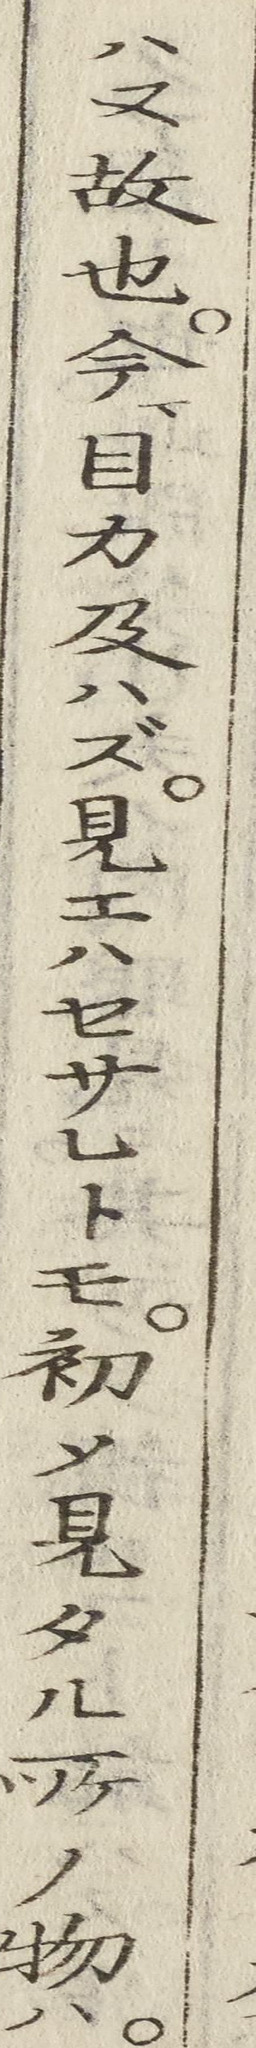ハヌ故也。今目力及ハズ。見エハセサレトモ。初メ見タル所ノ物ハ。
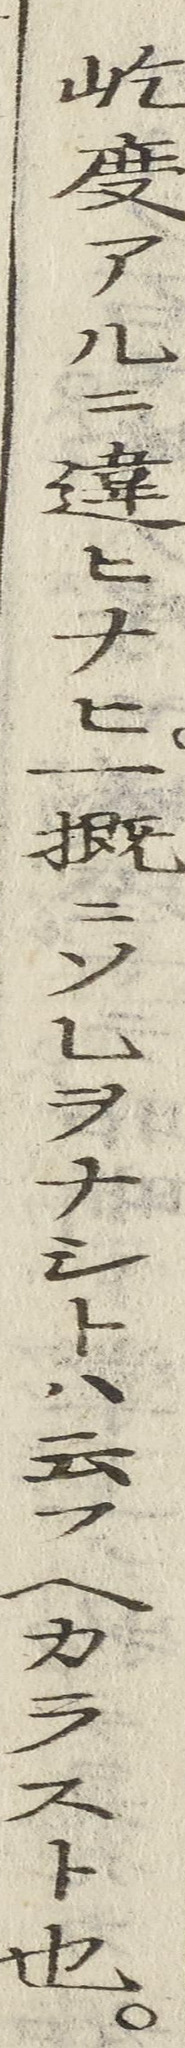屹度アルニ違ヒナヒ。一概ニソレヲナシトハ云フヘカラスト也。
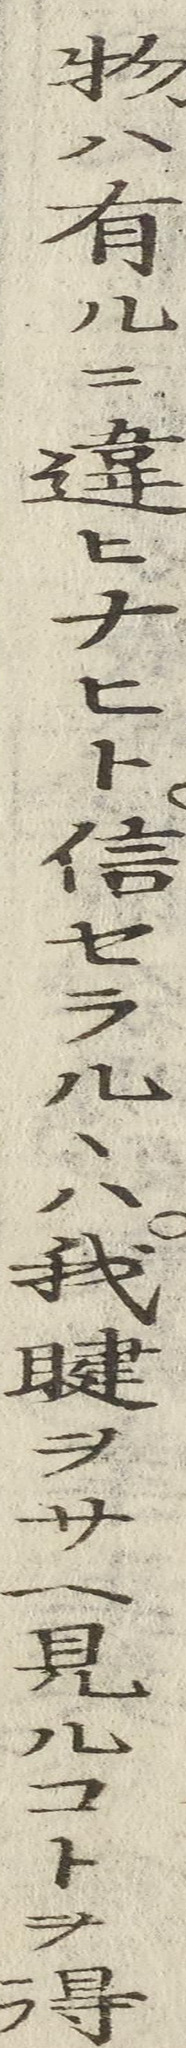物ハ有ルニ違ヒナヒト。信セラルヽハ。我睷ヲサヘ見ルコトヲ得
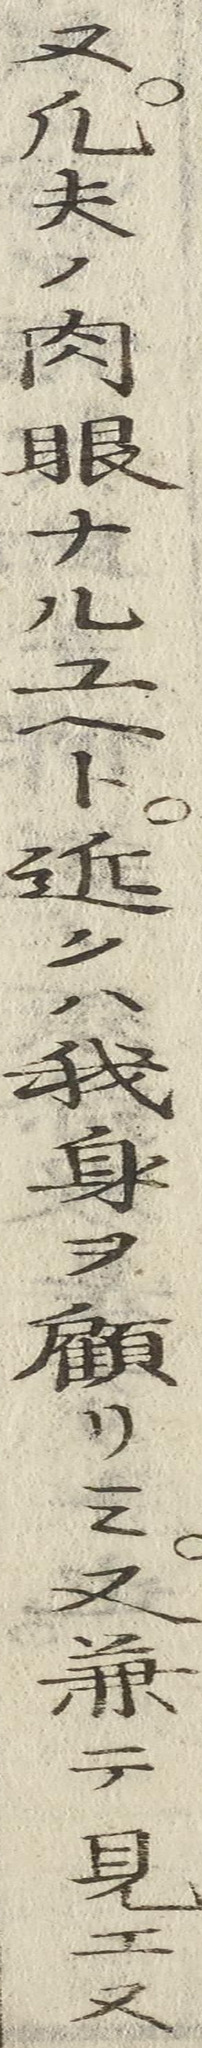ヌ。凡夫ノ肉眼ナルユヘト。近クハ我身ヲ顧リミ。又兼テ見エヌ
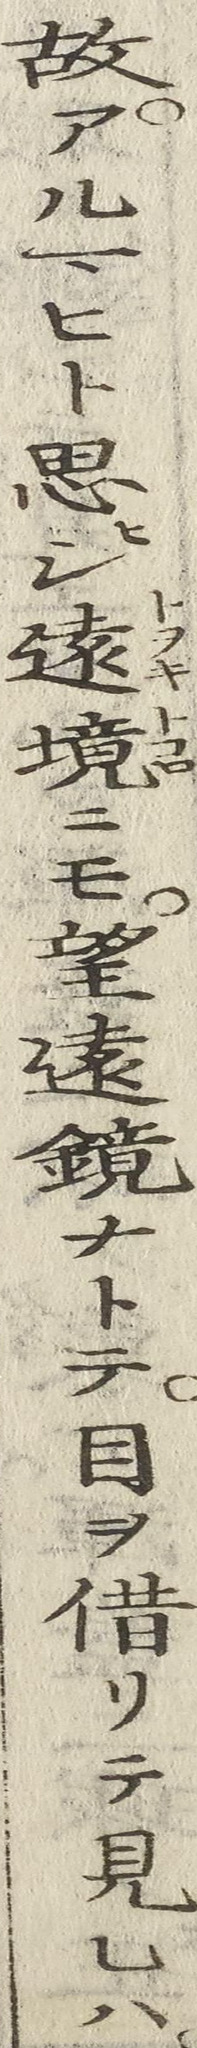故。アルマヒト思遠境ニモ。望遠鏡ナトテ。目ヲ借リテ見レハ。
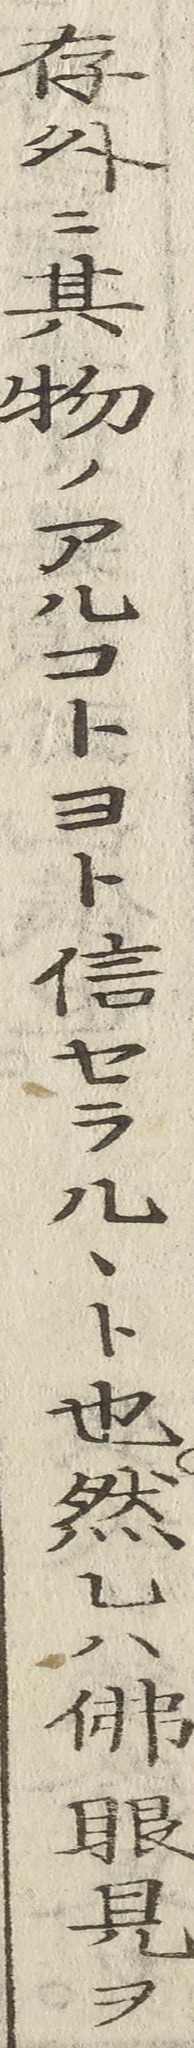存外ニ其物ノアルコトヨト信セラルヽト也。然レハ仏眼見ヲ
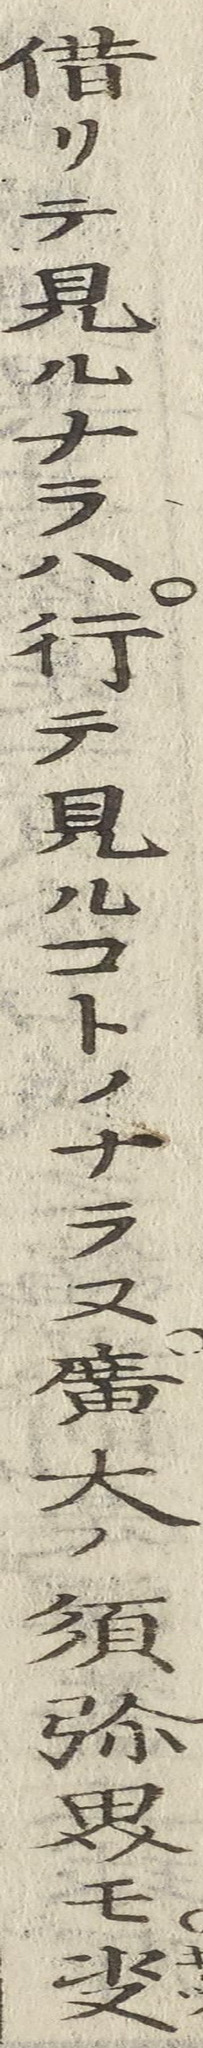借リテ見ルナラハ。行テ見ルコトノナラヌ。広大ノ須弥界モ。決
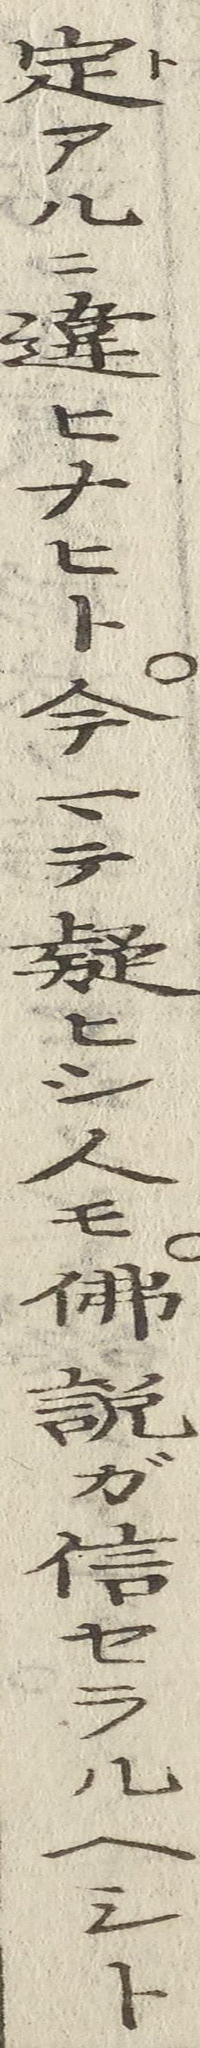定アルニ違ヒナヒト。今マテ疑ヒシ人モ。仏説ガ信セラルヘシト
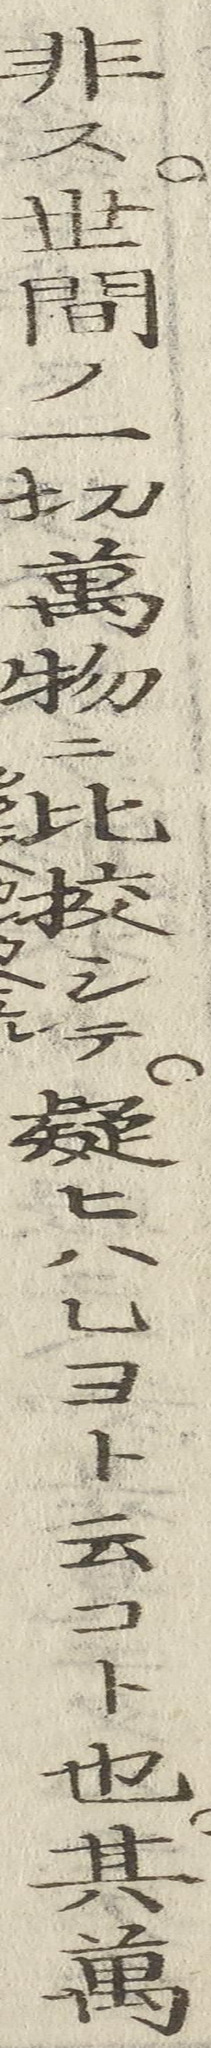非ス。世間ノ一切万物ニ比挍シテ。疑ヒハレヨト云コト也。其万
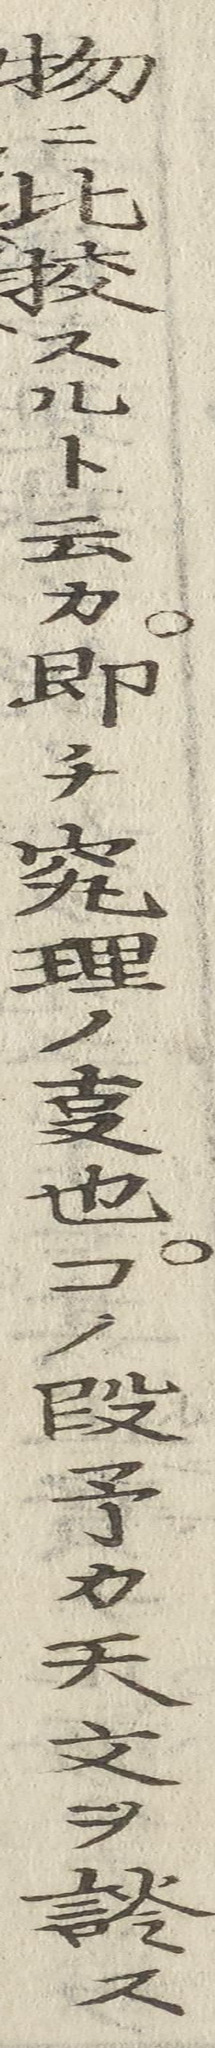物ニ比挍スルト云カ。即チ究理ノ事也。コノ段予カ天文ヲ談ス

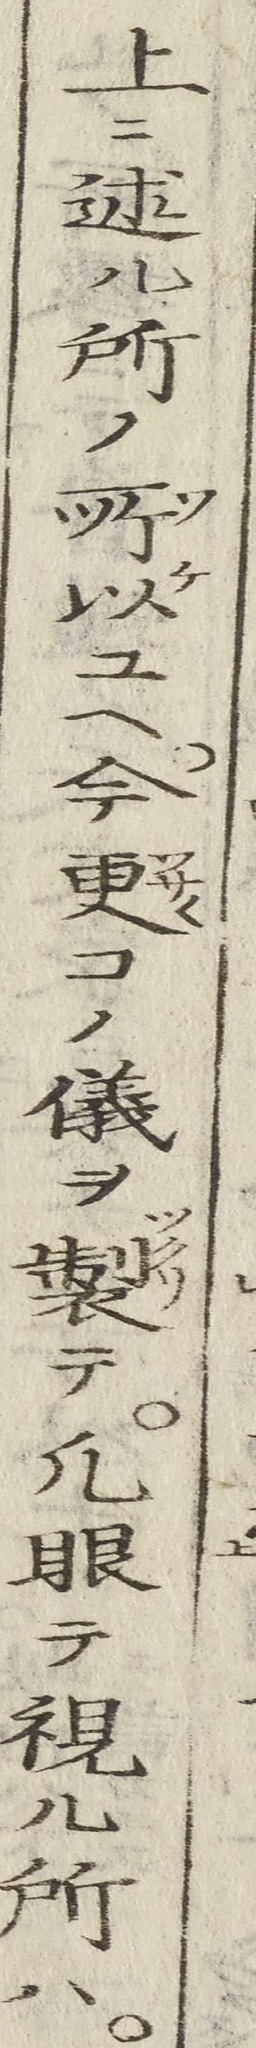上ニ述ル所ノ所以ユヘ。今更コノ儀ヲ製テ。凡眼テ視ル所ハ。
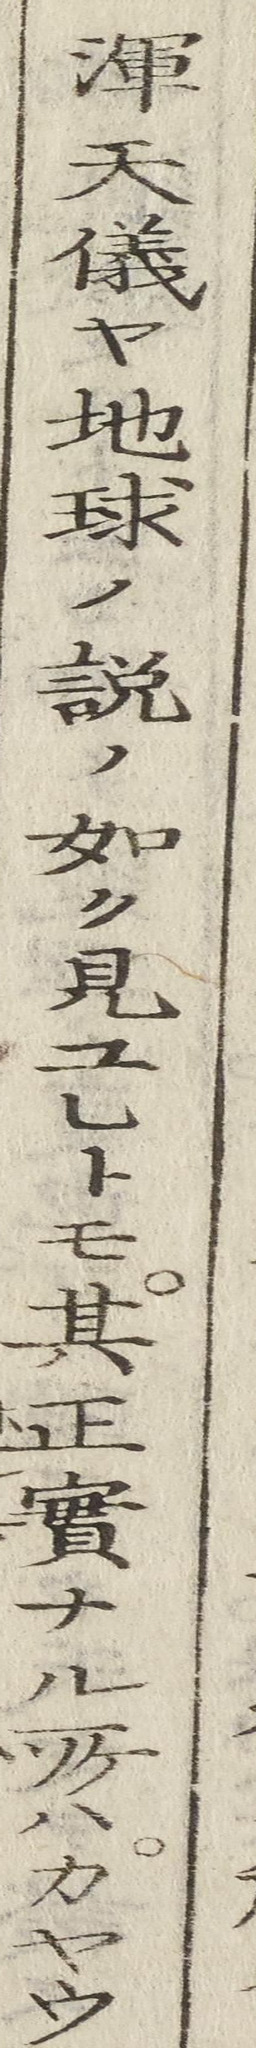渾天儀ヤ地球ノ説ノ如ク見ユレトモ。其正実ナル所ハ。カヤウ
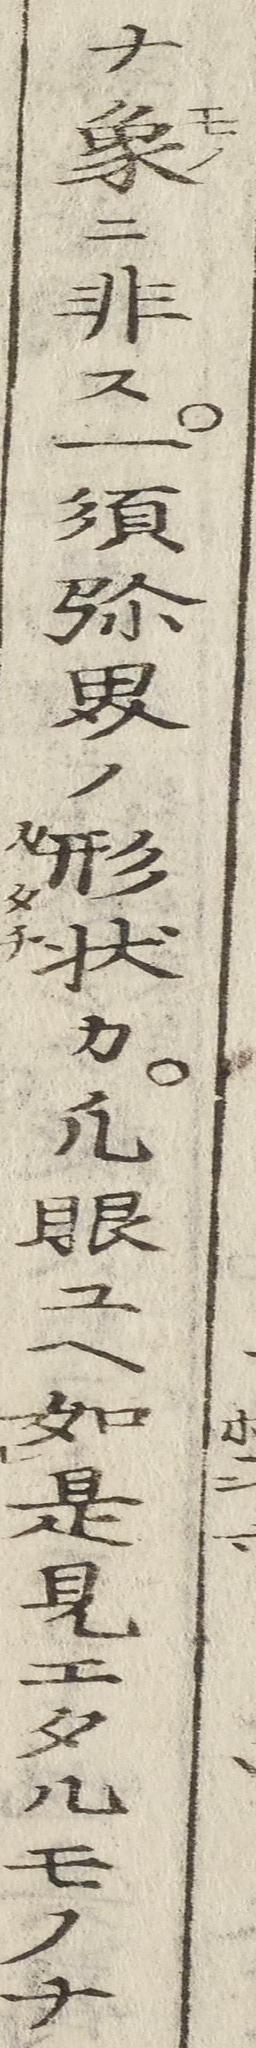ナ象ニ非ス。一須弥界ノ形状カ。凡眼ユヘ如是見エタルモノナ
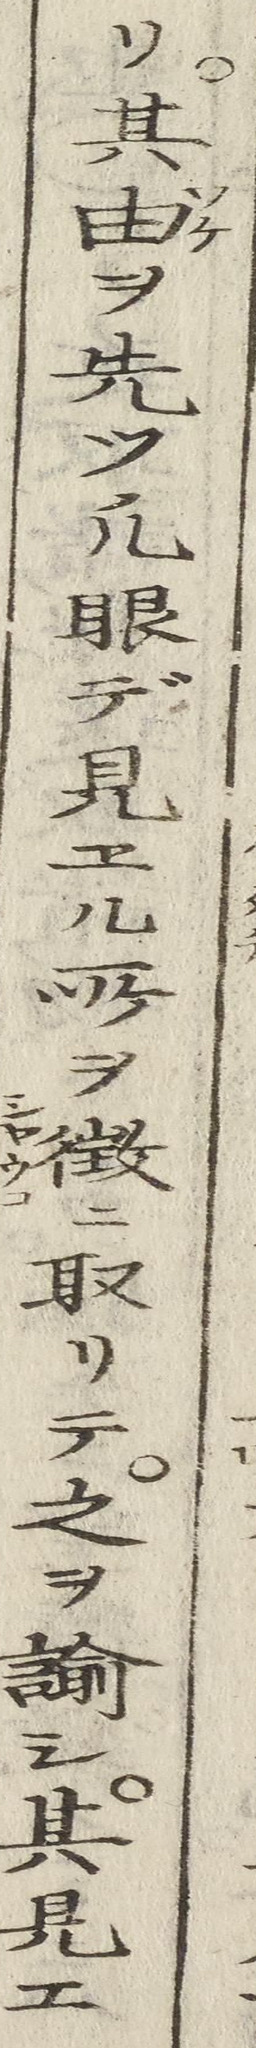リ。其由ヲ先ツ凡眼デ見エル所ヲ徴ニ取リテ。之ヲ諭シ。其見エ
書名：護法新論　上
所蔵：東京大学地震研究所図書室 Earthquake Research Institute Library, The University of Tokyo, JAPAN
